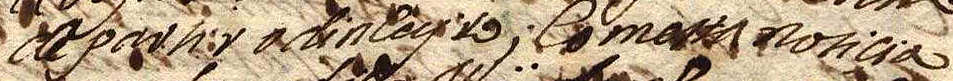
de partir o dinheyro; com esta noticia
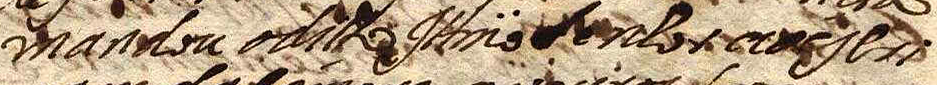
mandou o ditto Jllmo Senhor ao escri
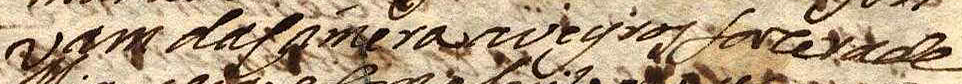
vam da Camera a veyros fazer a de
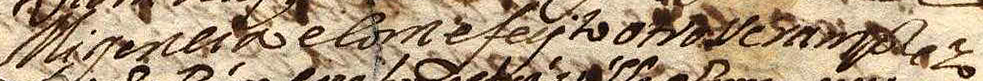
lligencia e com efeyto o trosseram pRezo
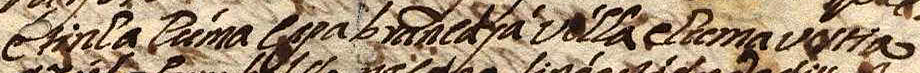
e tinha huma capa branca já velha e huma vestia
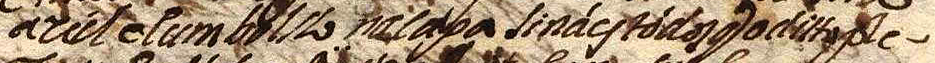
azul e hum bolsso na capa sináes todos q̄ o ditto pRe
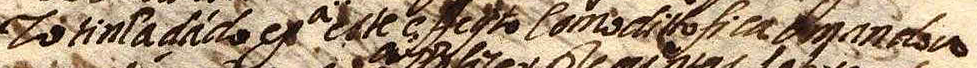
zo tinha dádo e pa este effeyto como ditto fica o mandou
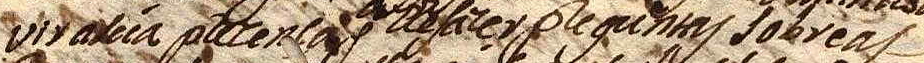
vir a sua prezença pa lhe fazer preguntas sobre as
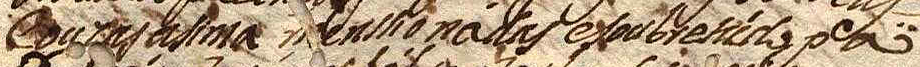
couzas asima menssionadas e soubretudo pa
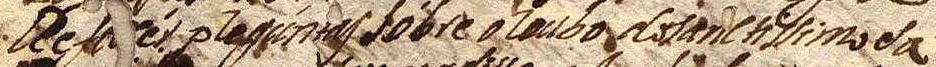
lhe fa_er preguntas sobre o Roubo do sanctissimo sa
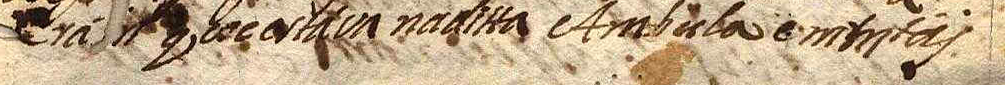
cra_ que estava na ditta Ambula em mtas
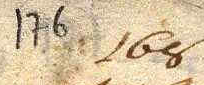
168
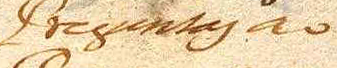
Preguntas ao
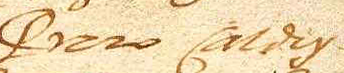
Prezo Caldey
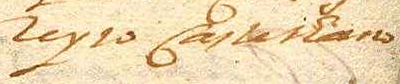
Reyro Castelhano
